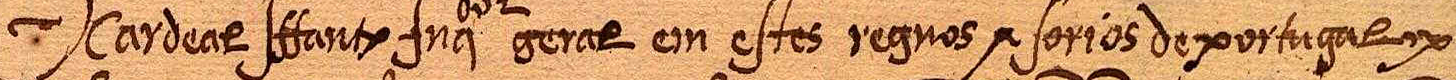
O Cardeal Jffantꝭ Jnqdor geral em estes regnos e sorios de portugal cꝭ
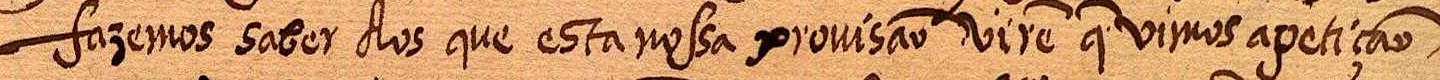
fazemos saber Aos que esta nossa prouisão virē q̄ vimos a petição
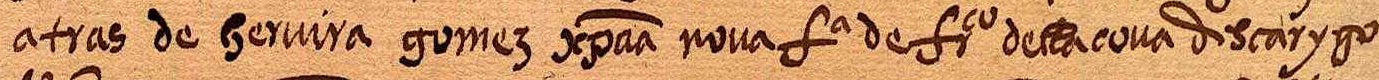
atras de heruira gomez xpāa noua fa de frco della coua descarygo
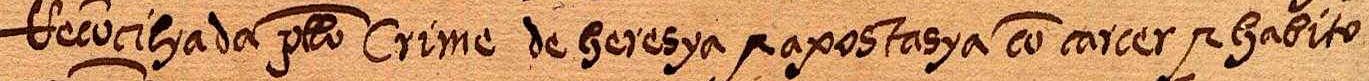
Recōcilyada p̄llo Crime de heresya e apostasya c̄o carcer e habito
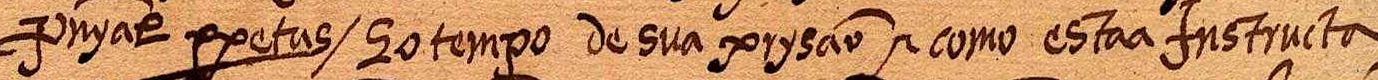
pnȳal ꝑpetus / E o tempo de sua prysaõ e como estaa Jnstructa
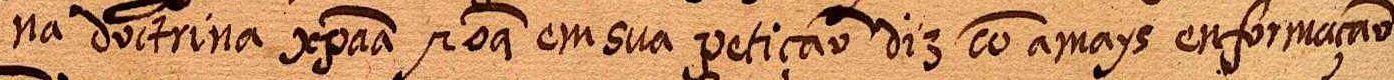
na doctrina xpāa e o q̄ em sua petiçaõ diz c̄o a mays enformação
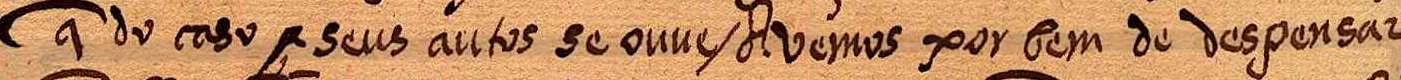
q̄ do caso e seus autos se ouue / Avemos por bem de despensar
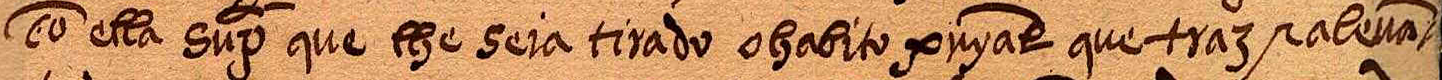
c̄o ella supte que lhe seia tirado o habito pnȳal que traz e aleuā
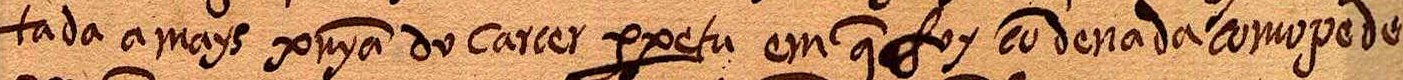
tada a mays pn̄ya do carcer ꝑpetu em q̄ foy c̄odenada como pede
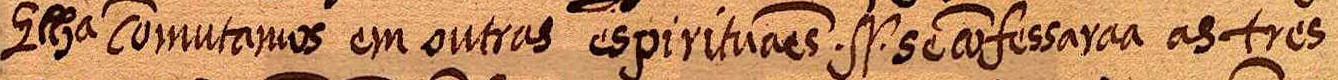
E lha c̄omutamos em outras espirituāes .ss. se c̄ofessaraa as tres
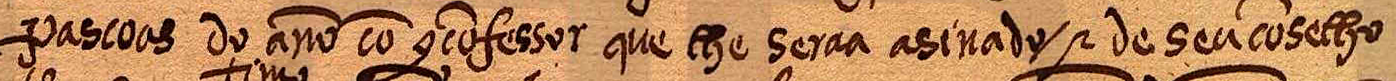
pascoas do an̄o c̄o o c̄ofessor que lhe seraa asinado / e de seu c̄oselho
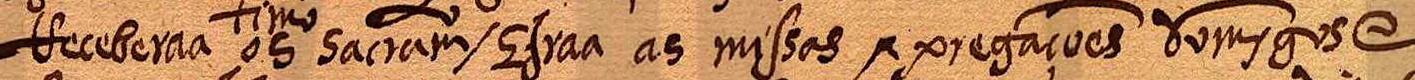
Receberaa o Stimo Sacramto / E Jraa as missas e pregações domȳgos e
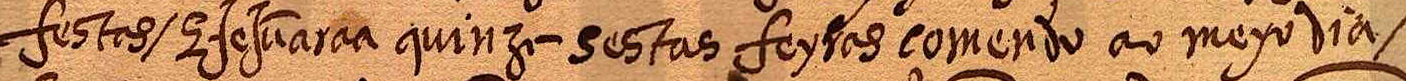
festas / E JeJūaraa quinze sestas feyras comendo ao meyo dia /
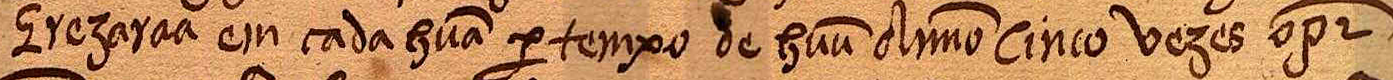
E rezaraa em cada huā ꝑ tempo de huū Anno cinco vezes o p̄r
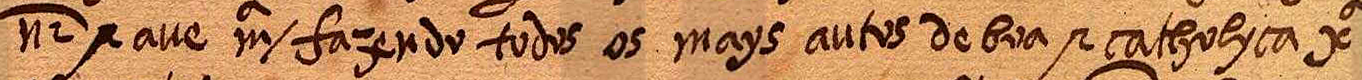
n̄r e aue ma / fazendo todos os mays autos de boa e catholyca xa
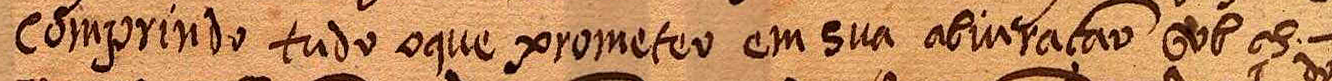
comprindo tudo o que prometeo em sua abiuraçãoaõ sob as
